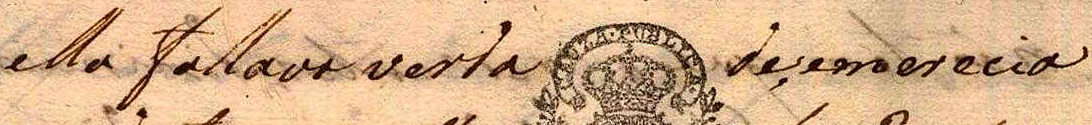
ella fallava verda de, e merecia
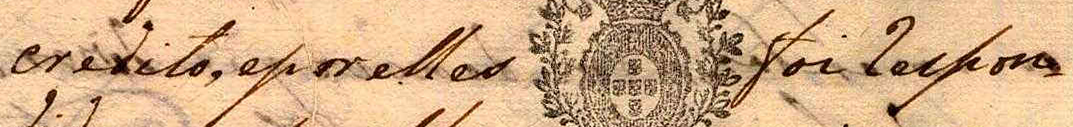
credito, e por elles foi Respon
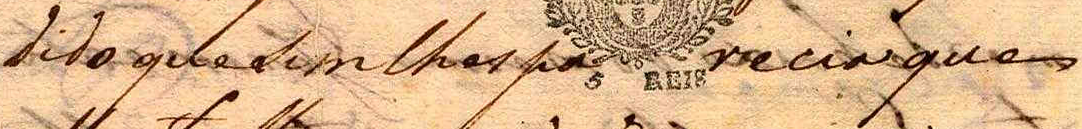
dido que sim lhes pa recia que
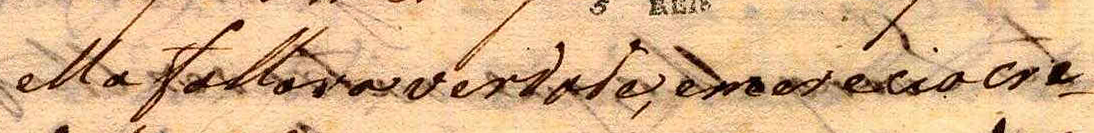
ella fallava verdade, e merecia cre
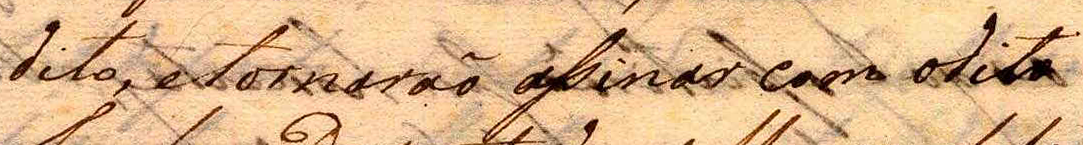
dito, e tornaraõ assinar com o dito
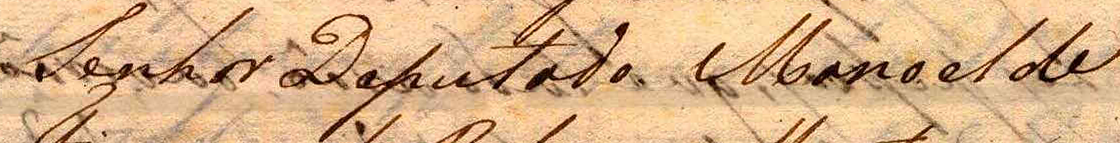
Senhor Deputado. Manoel de
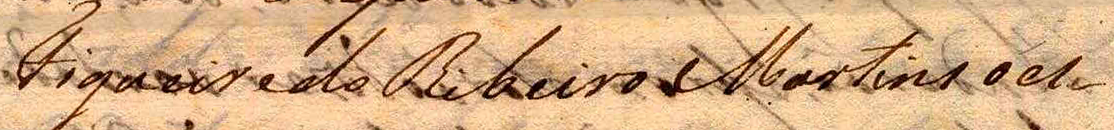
Figueiredo Ribeiro Martins o es
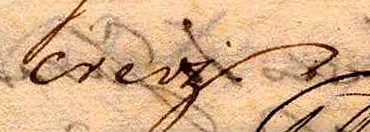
crevy
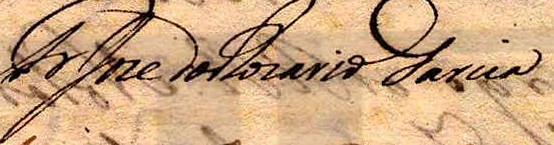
Fr Joze do Rozario Garcia
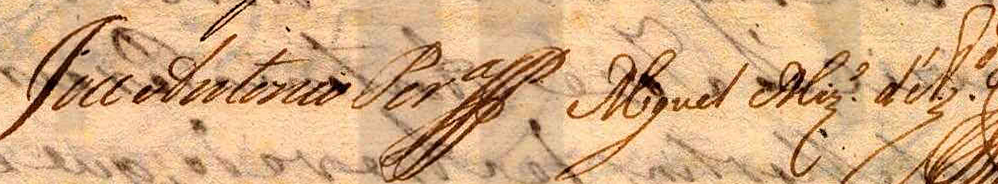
Joce Antonio Per.a Miguel Miz̄ d'Az.do
